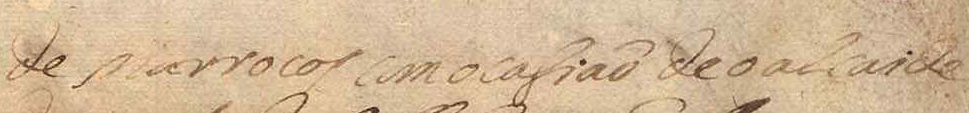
de Marrocos com ocasiaõ de o alcaide
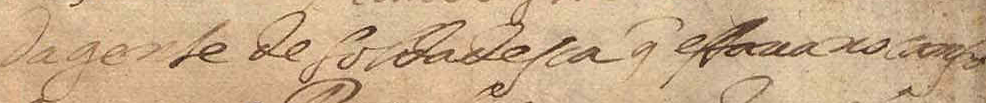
da gente de soldadesca q̄ estaua no campo
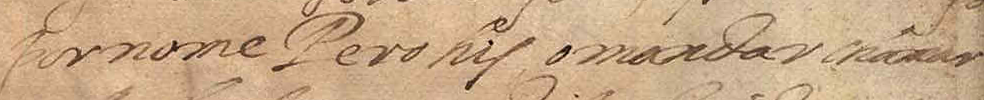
por nome Pero his o mandar chamar
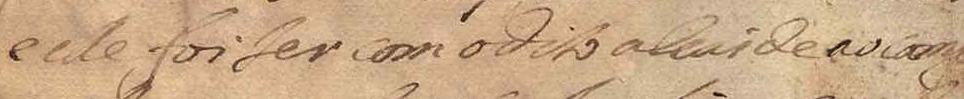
e elle foi ter com o dito alcaide ao campo
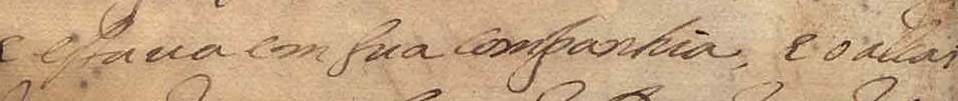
E estaua em sua companhia, E o alcai
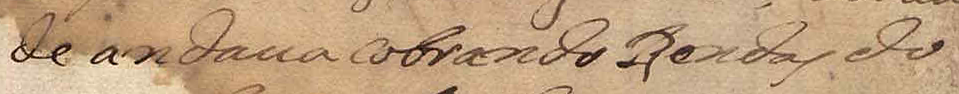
de andaua cobrando Rendas do
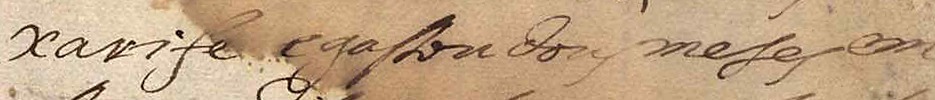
xarife e gastou dous meses em
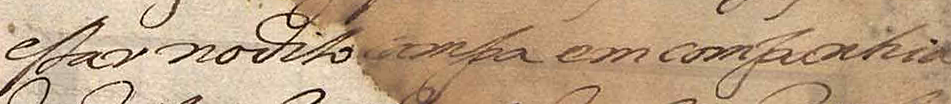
estar no dito campa em companhia
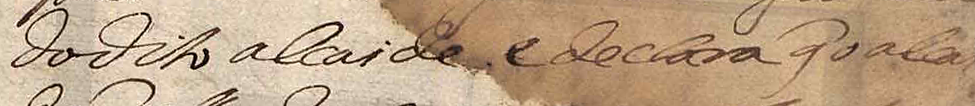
do dito alcaide e declara q̄ o alcai
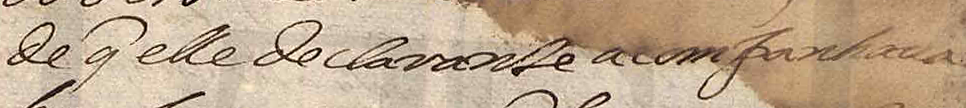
de q̄ elle declarante acompanhaua
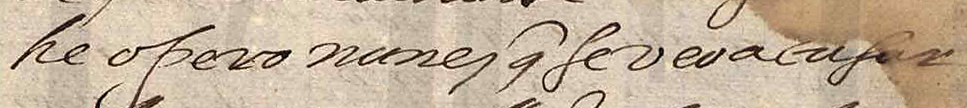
he o pero nunez q̄ se veo acusar
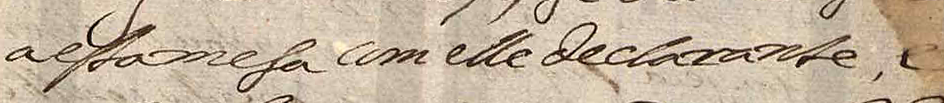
a esta mesa com elle declarante, E
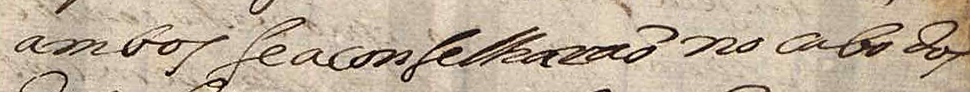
ambos se aconselharaõ no cabo dos
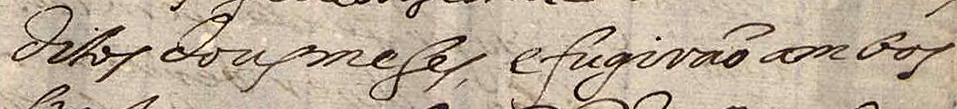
ditos dous meses, e fugiraõ ambos
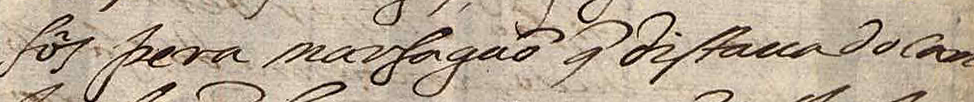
sôs pera marsagão q̄ distaua do cam
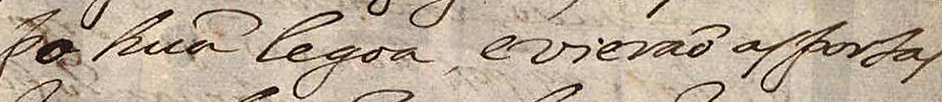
po huā legoa, e vieraõ as portas
